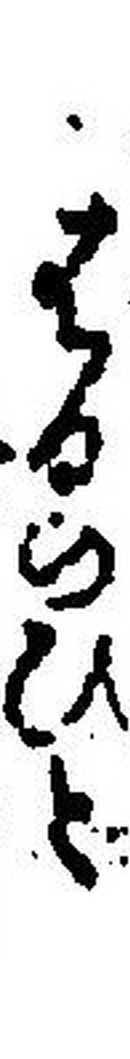はるのひと
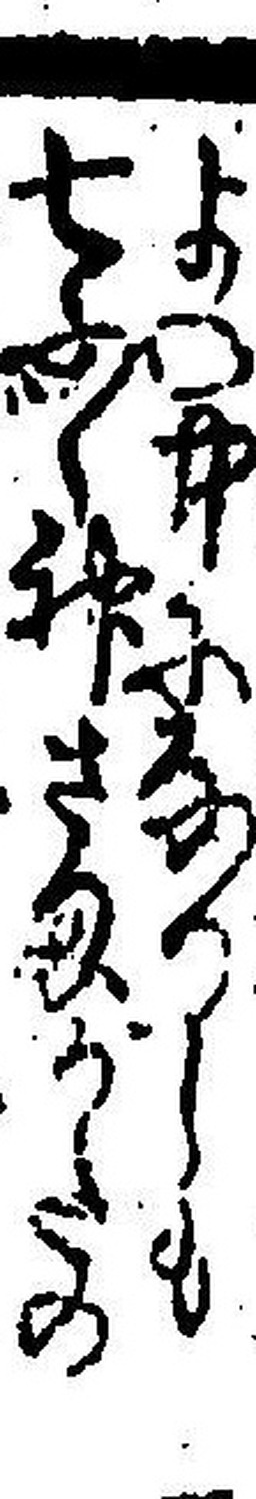七ふく神さまかたの
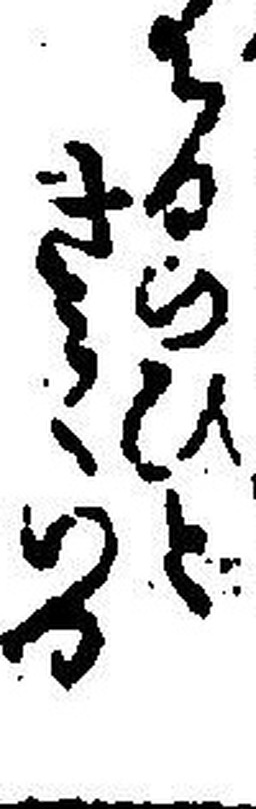きている
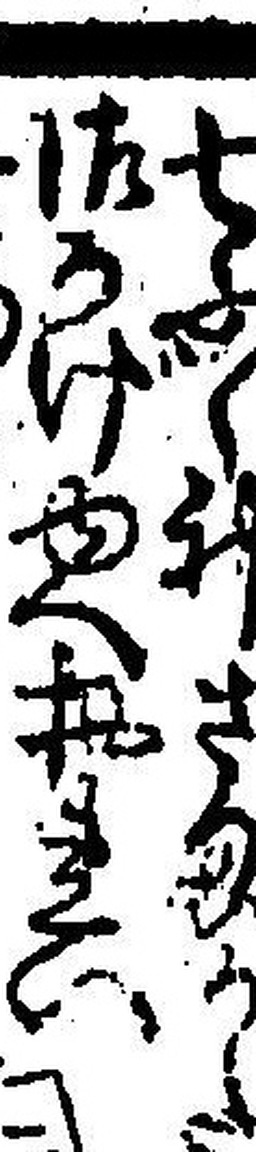御かげゆへおれい
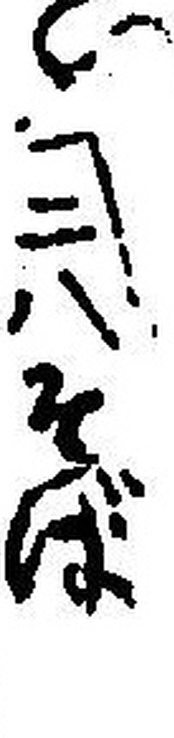〽二八そば
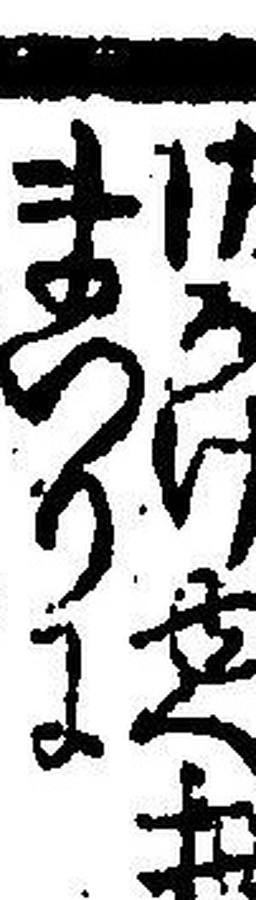まいりに
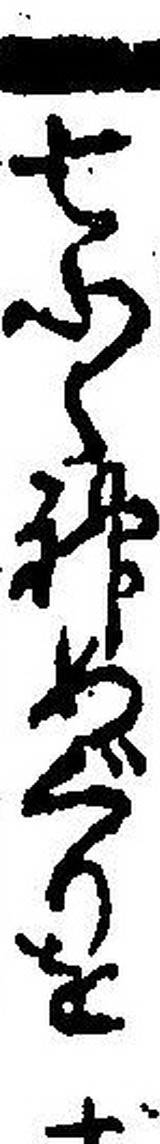七ふく神めぐりを
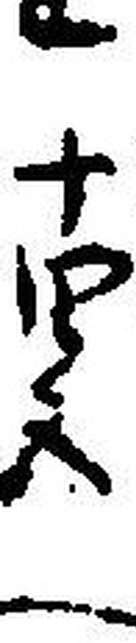十四五
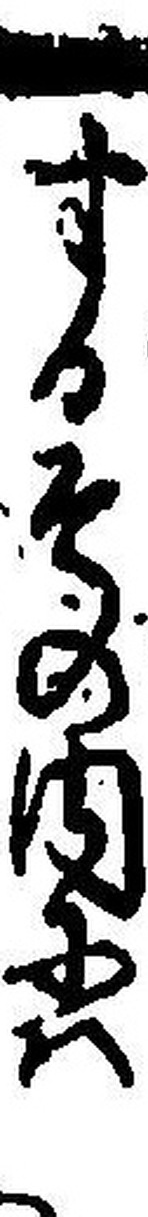するその内には
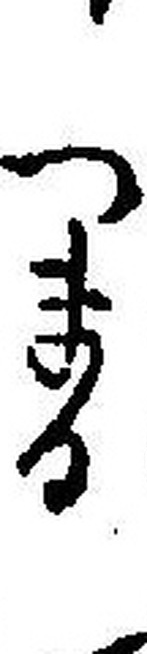つまる
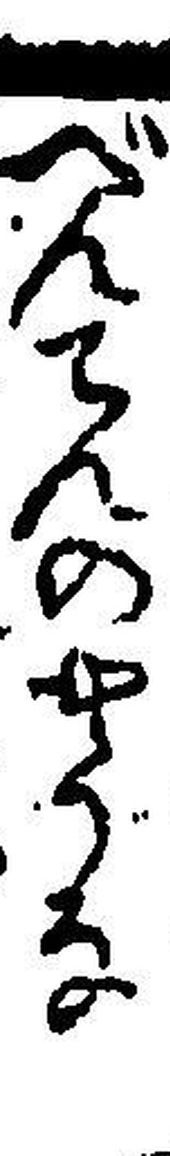べんてんのやうな
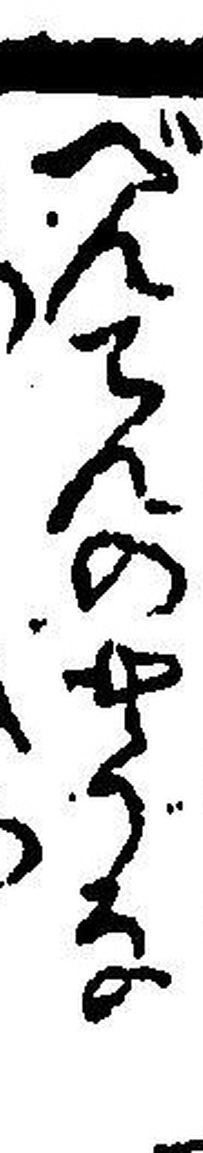べんてんのやうな
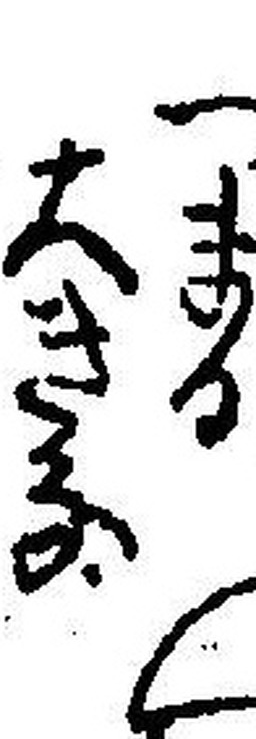大きな
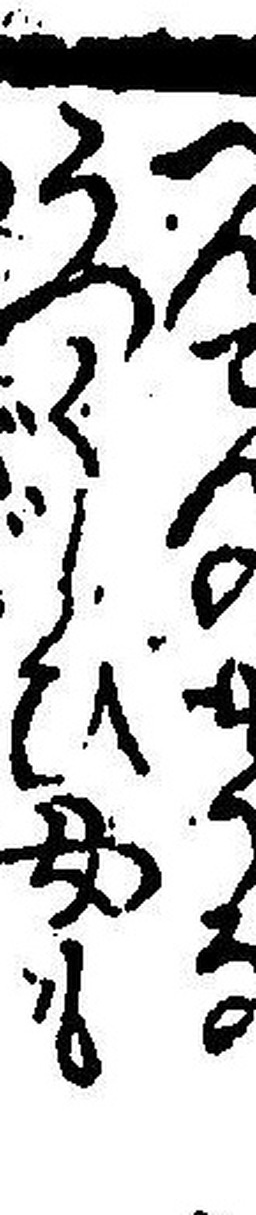うつくしひ女も
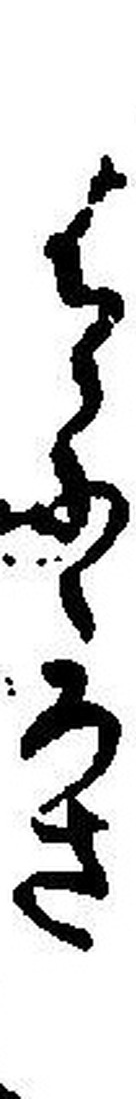はらふくろさ
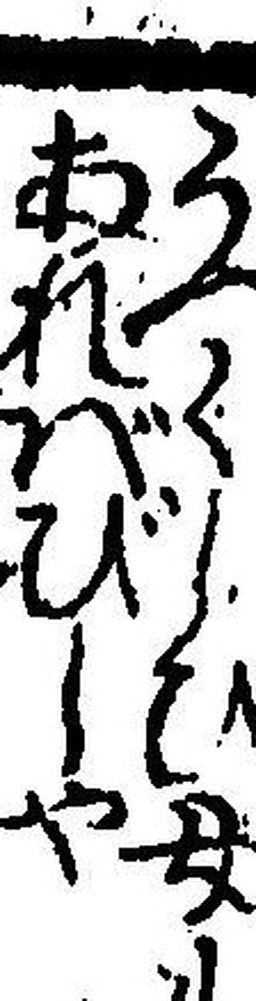あればびしや
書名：徳若水縁起金性 / 樹下石上作
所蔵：東京大学総合図書館 General Library in the University of Tokyo, JAPAN
